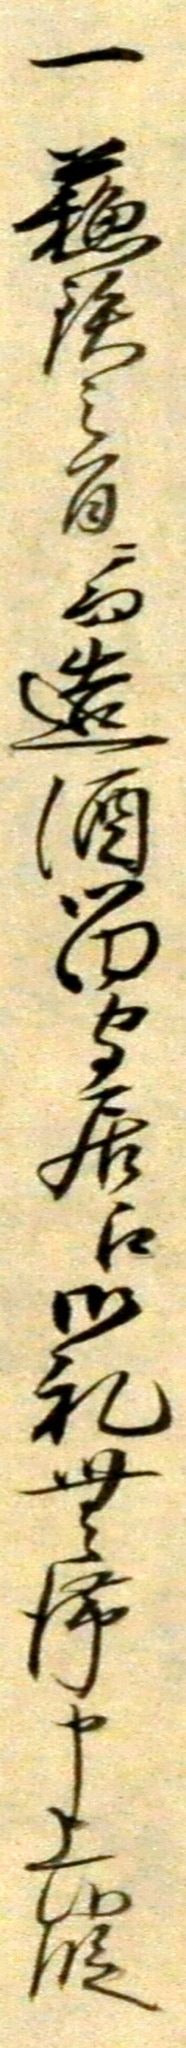一蘇鉄之間ニ而造酒留守居え御礼無滞申上候段
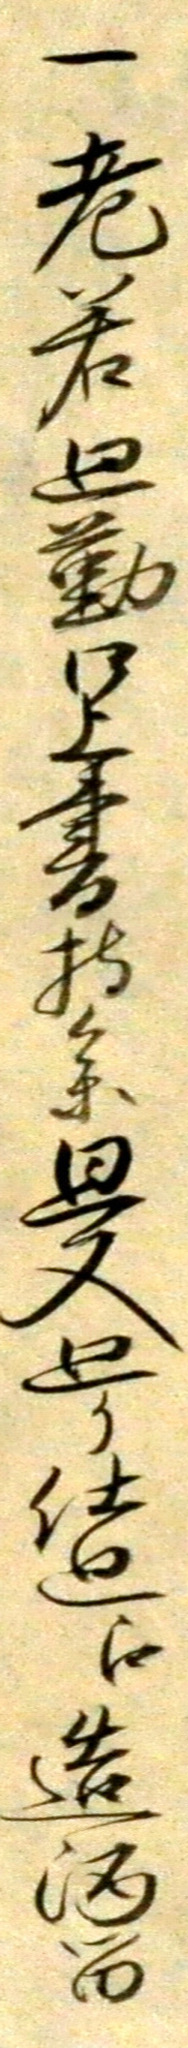一老若廻勤口上書持参且又廻り仕廻え造酒留
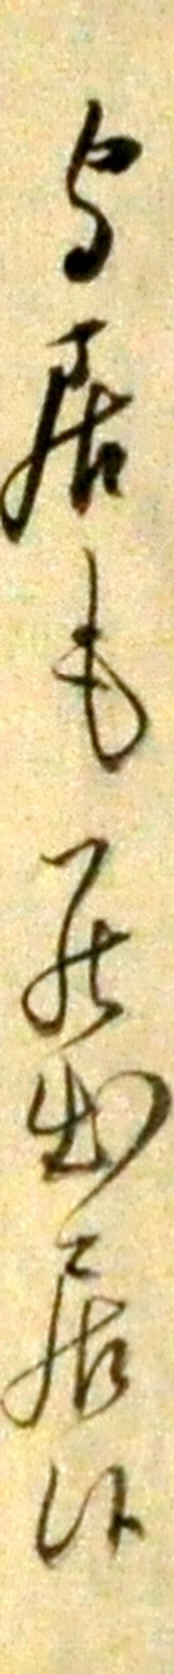守居も罷出居候
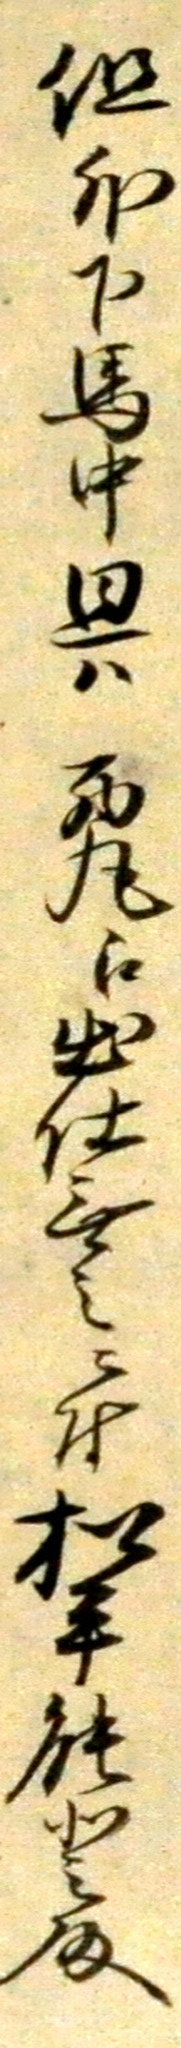但外下馬中且ハ西丸え出仕無之ニ付松平能登殿
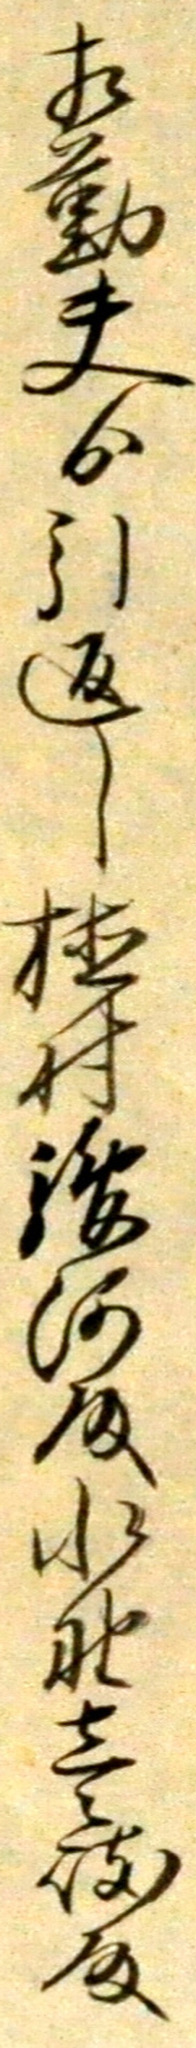相勤夫ゟ引返し植村駿河殿水野壱岐殿
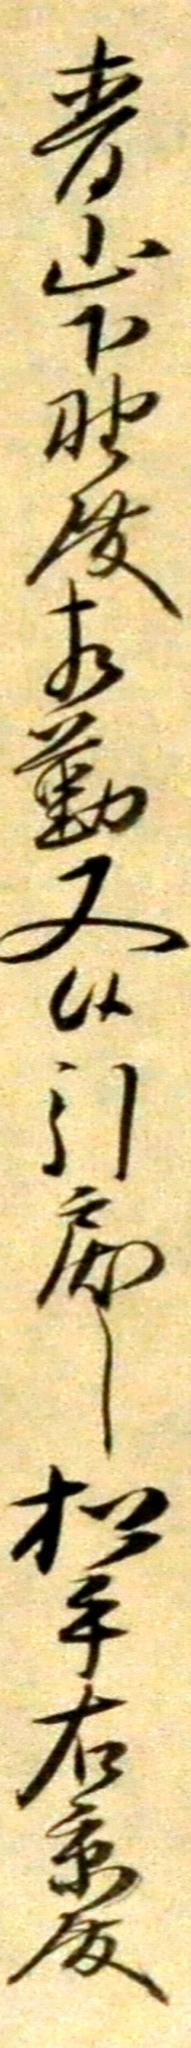青山下野殿相勤又候引戻し松平右京殿
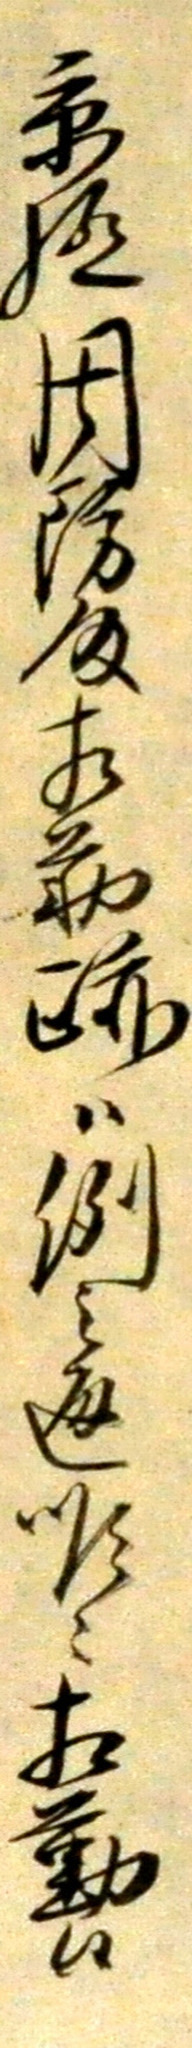京極周防殿相勤跡ハ例之通順々相勤候
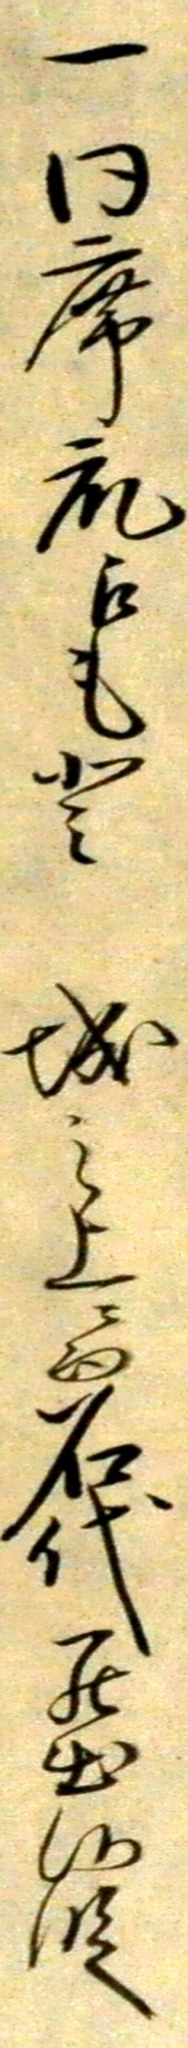一同席衆えも登城之上ニ而名代罷出候段
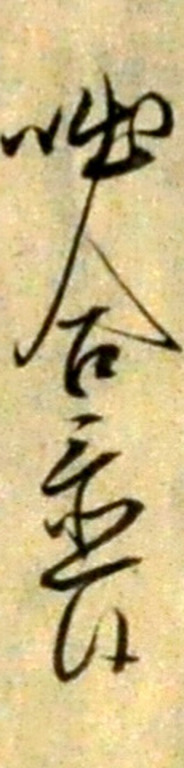咄合置候
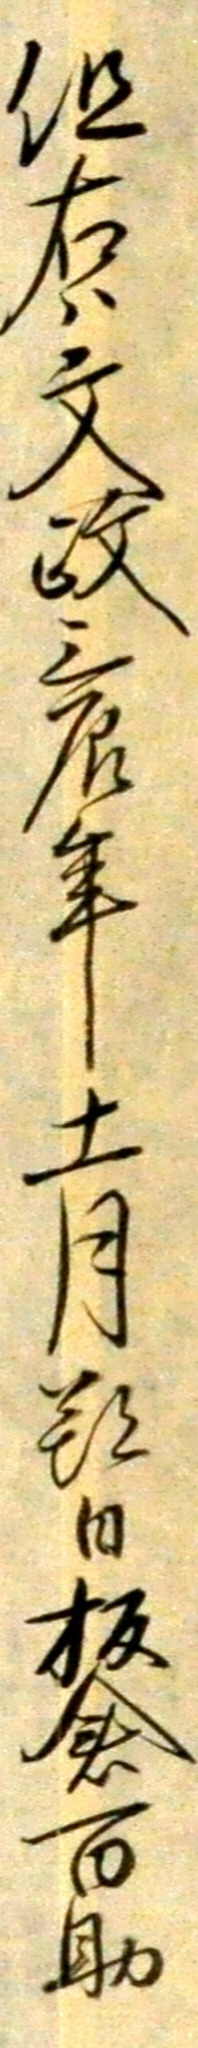但右ハ文政三辰年十一月朔日板倉百助
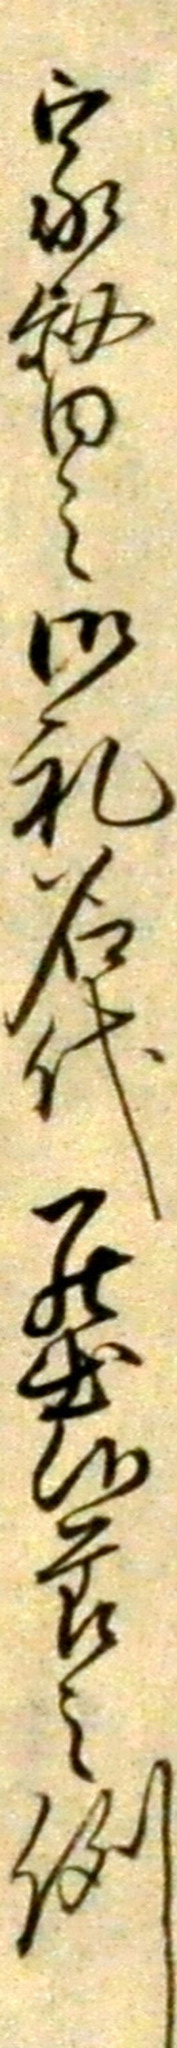家督之御礼名代罷出候節之例

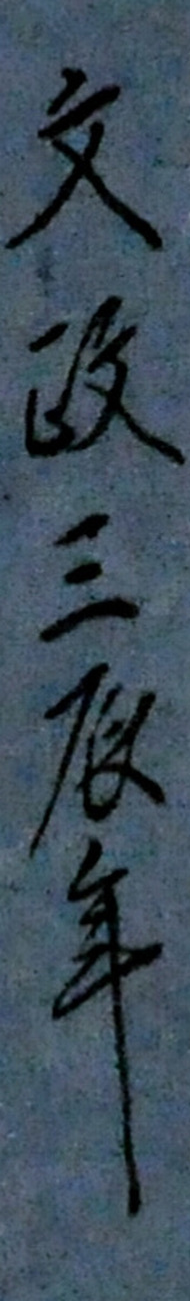文政三辰年
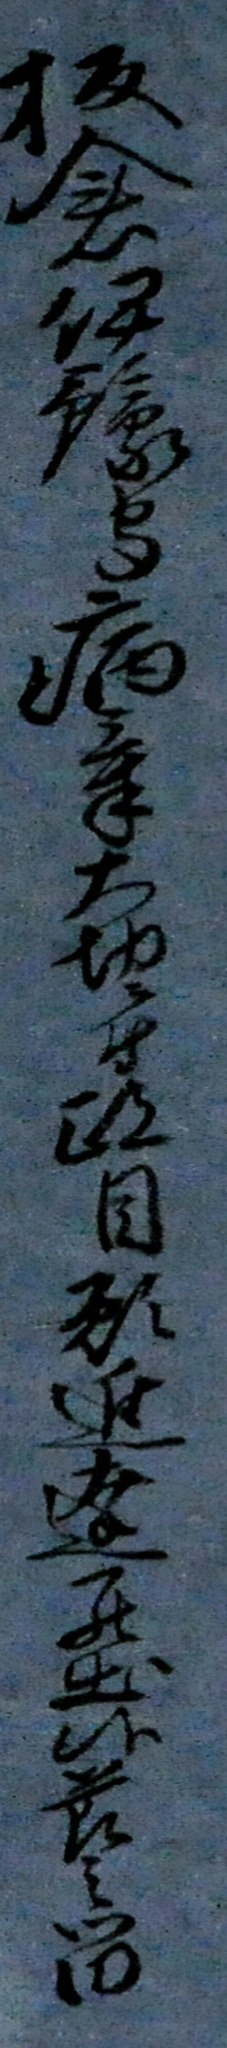板倉伊豫守病気大切ニ付跡目願進達罷出候節之留
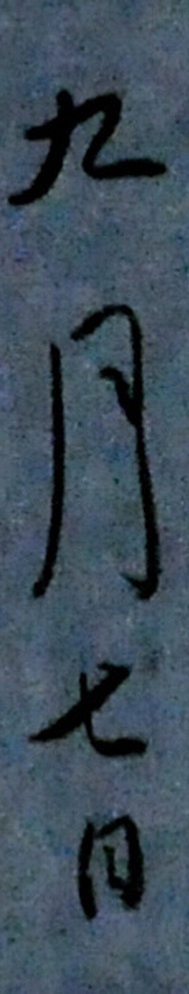九月七日
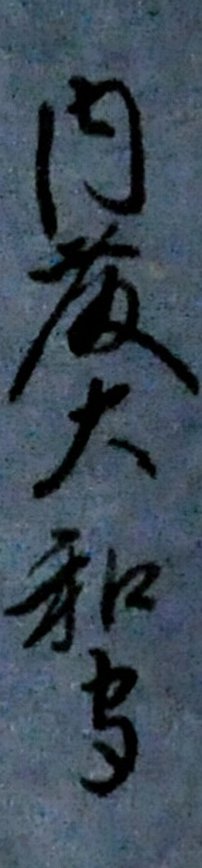内藤大和守

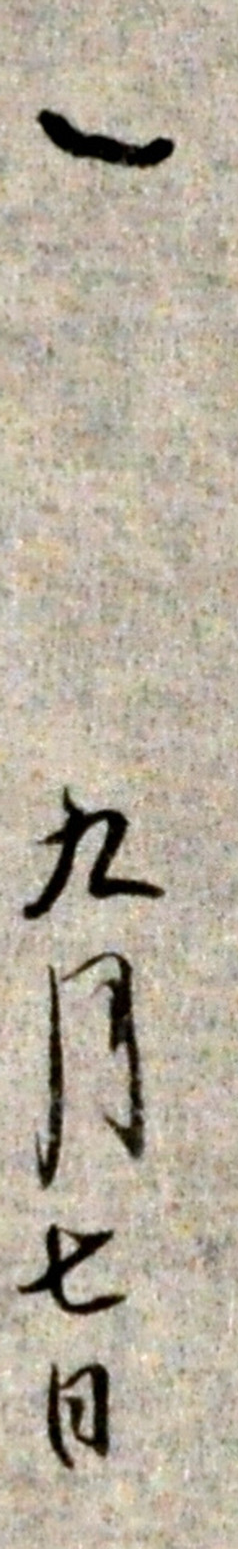九月七日
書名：諸名代相勤候節ノ留書外
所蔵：伊那市立高遠町図書館・合同会社AMANE
